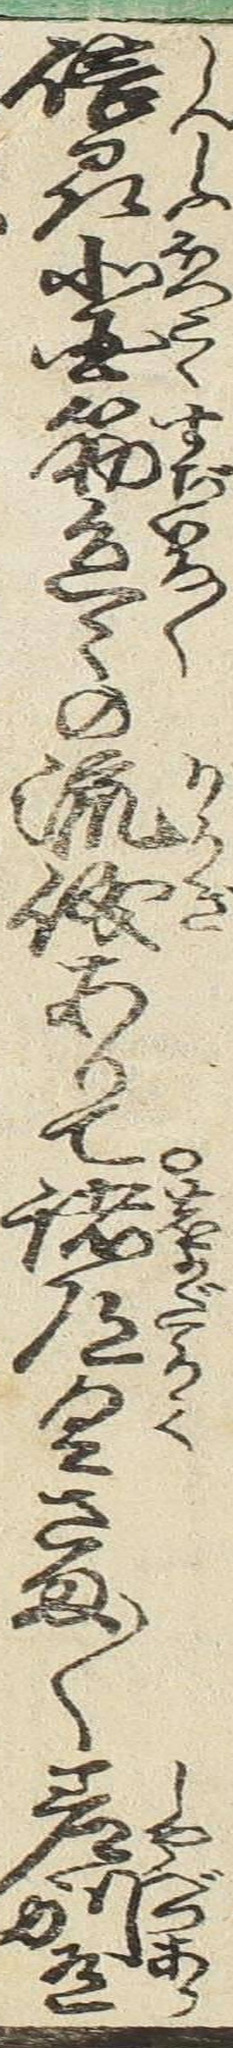信州北国筋色々の流儀ありて。諸道具さま〳〵差別有
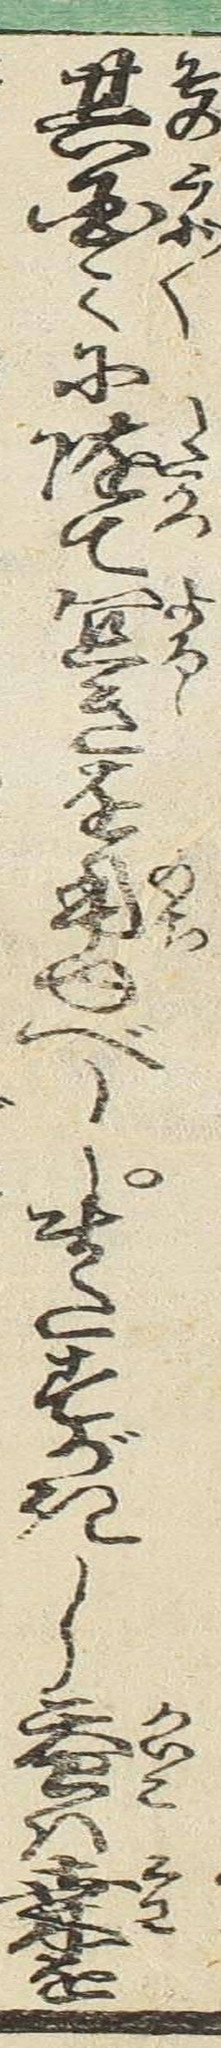其国々に随て宜きを用ゆべし。またすがきし蚕は桑を
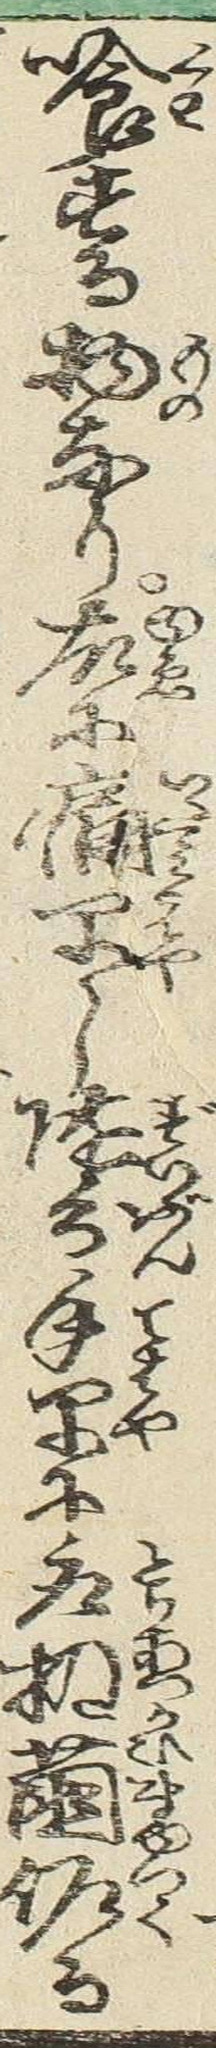喰する物なり。故に痛早し随分手早に取扱繭作る
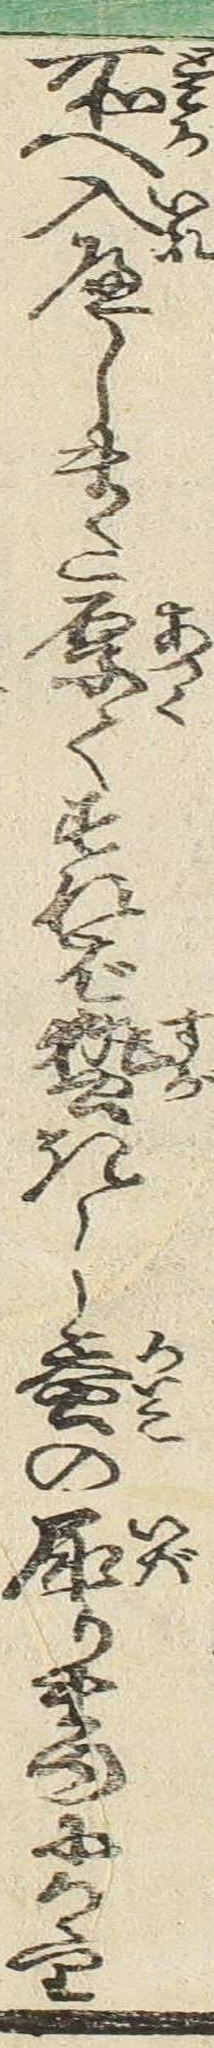所へ入へしまた厚くすれば蟄きし蚕の尿りまゆにかゝり
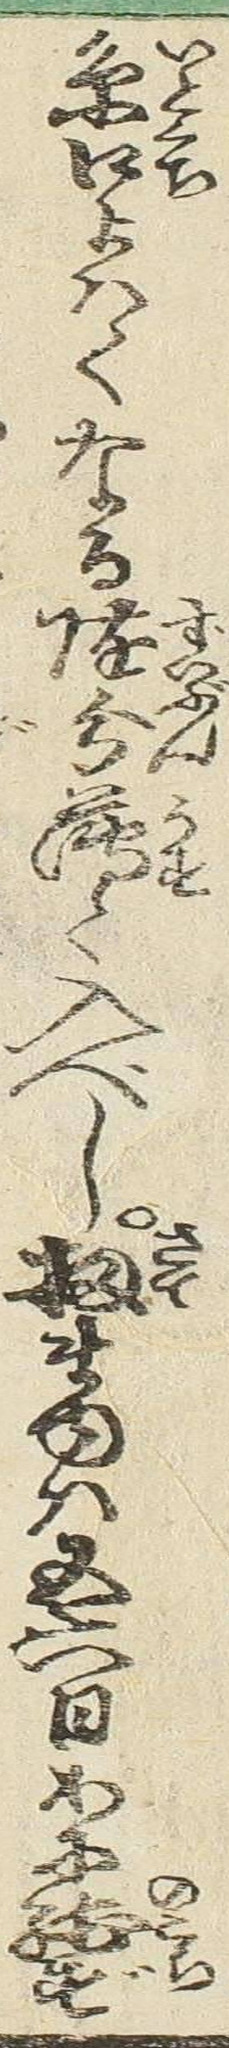糸口よはくなる随分薄く入べし。扨まゆは五六日めに残ず
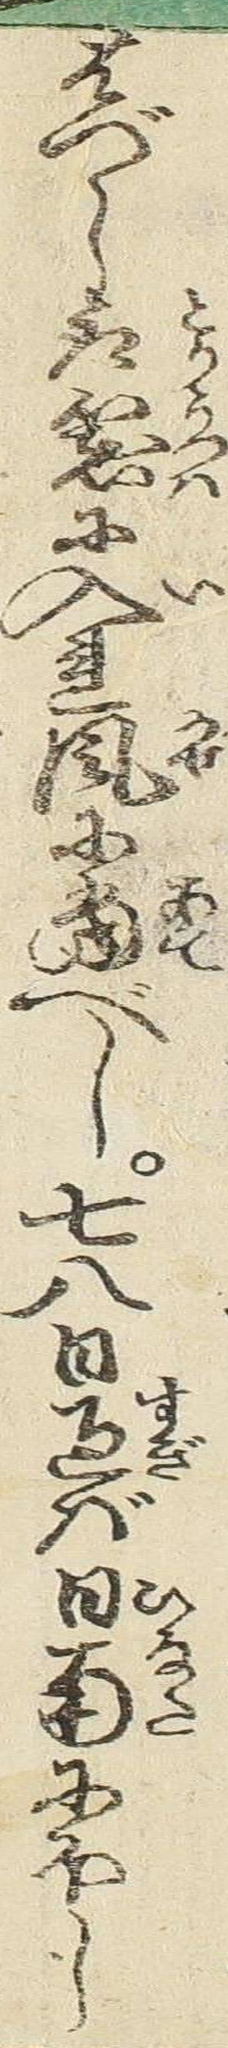はづし取器に入れ風に当べし。七八日過ば日南にほし
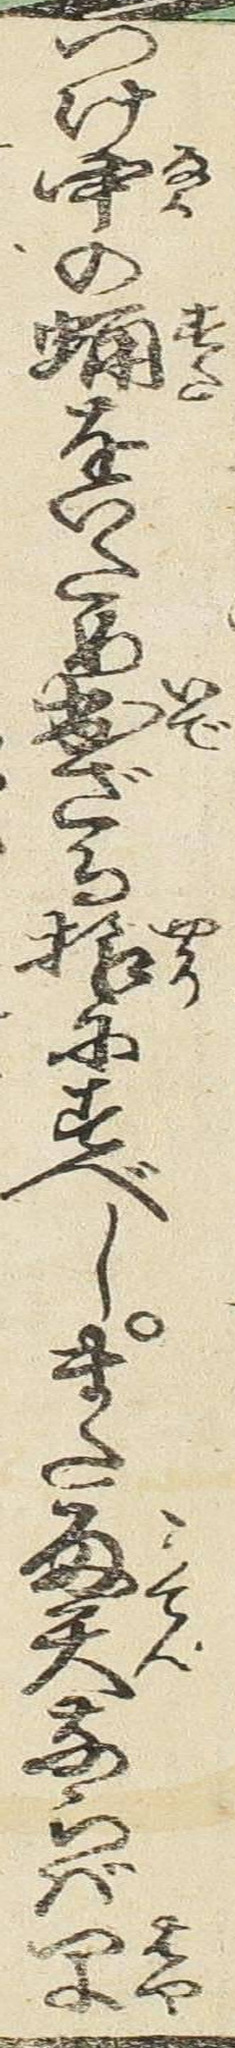つけ中の蛹をいため出ざる様にすべし。また雨天ならば早
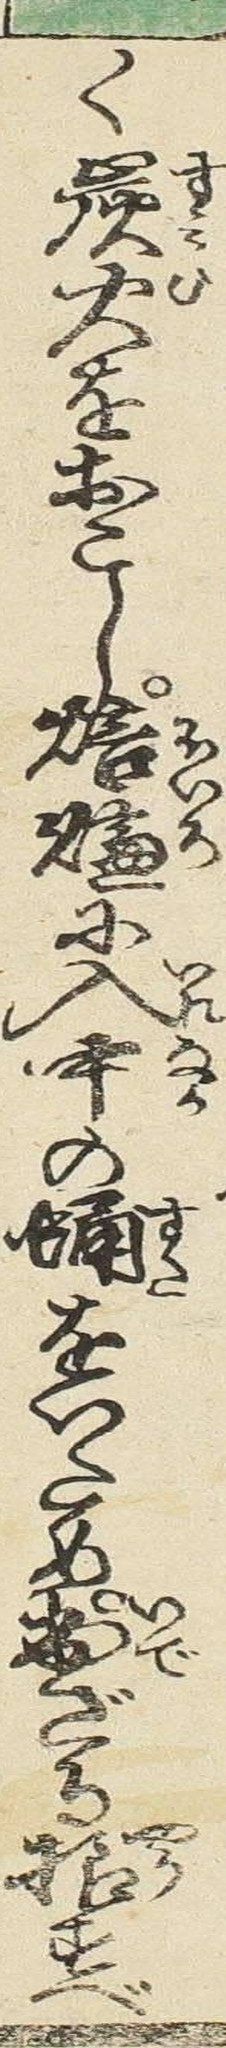く炭火をおこし。焙炉に入中の蛹をいため。出ざる様すべ
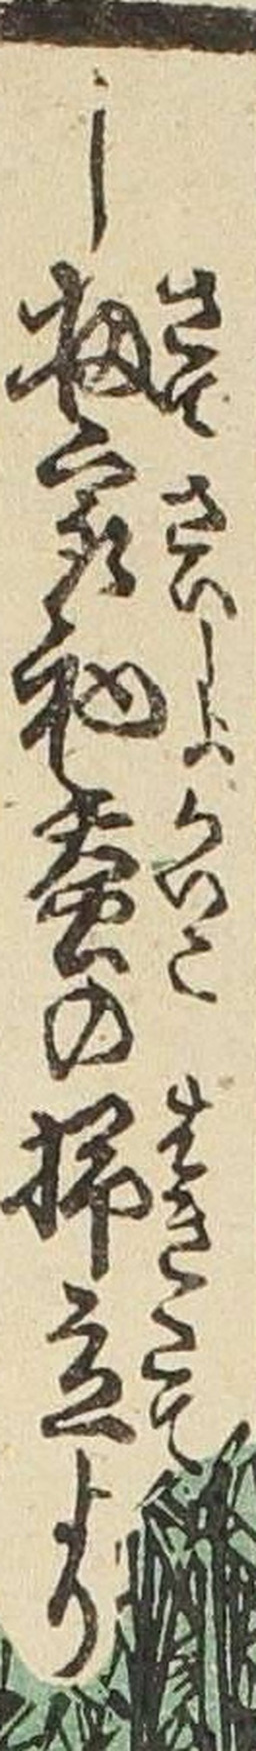し扨最初蚕の掃立より
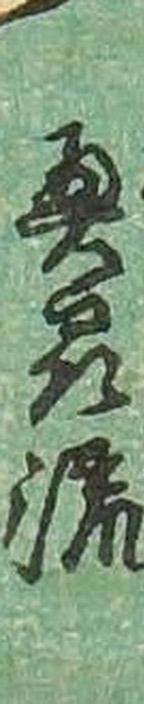奥州流
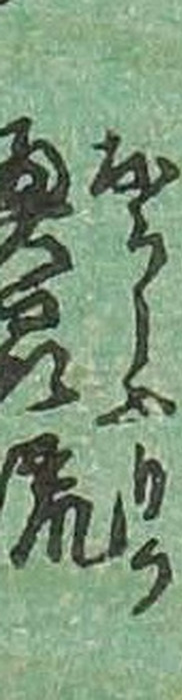奥州流
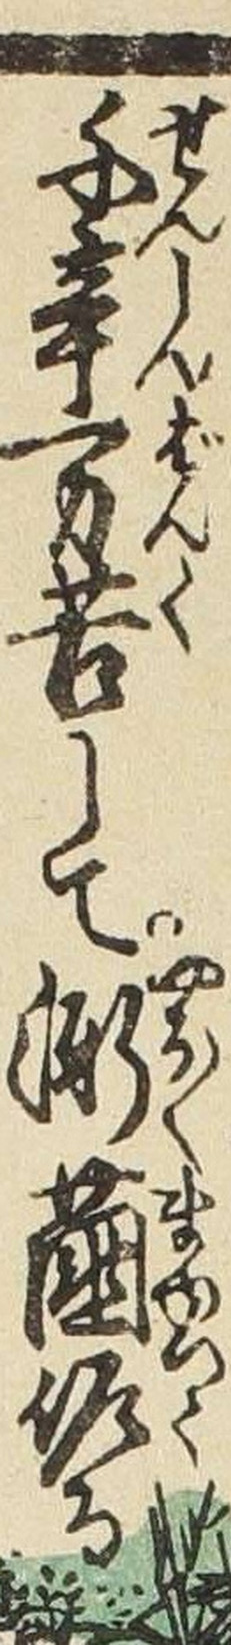千辛万苦して。漸繭作る
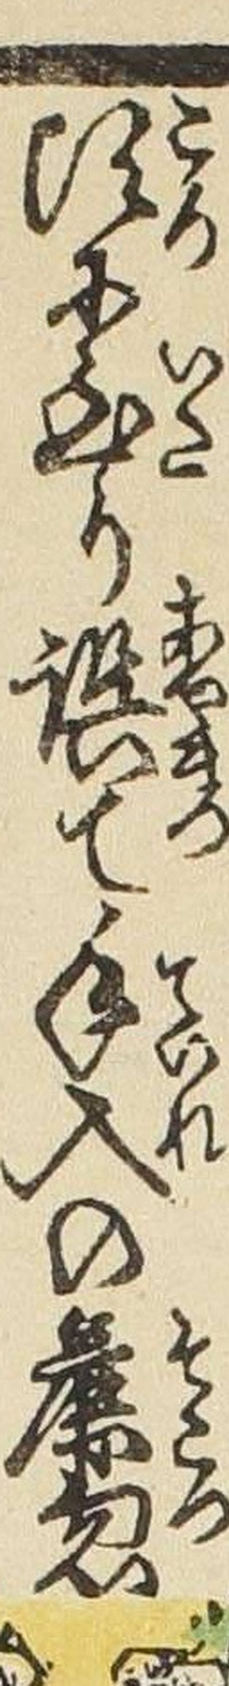頃に至り誤て手入の麁忽
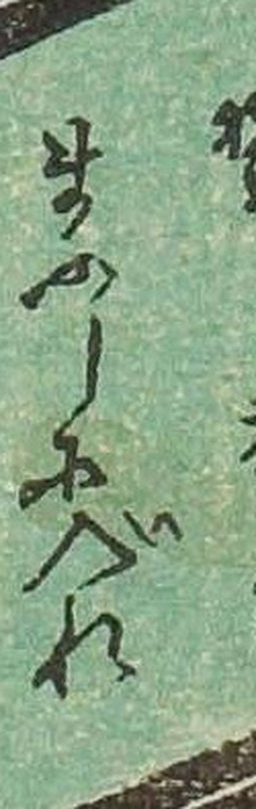まふしに入れ
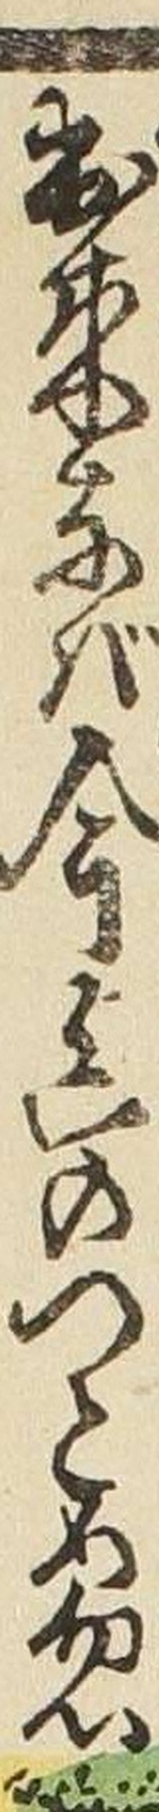出来なば今迄のつとめ忽
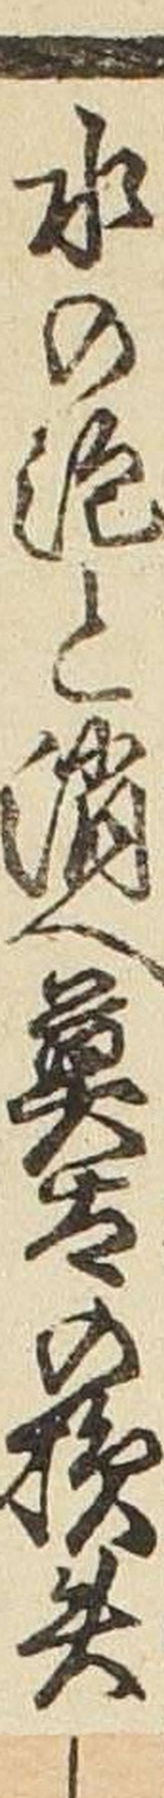水の泡と消へ莫太の損失
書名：養蠶圖解
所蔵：東京大学農学生命科学図書館 国文学研究資料館
